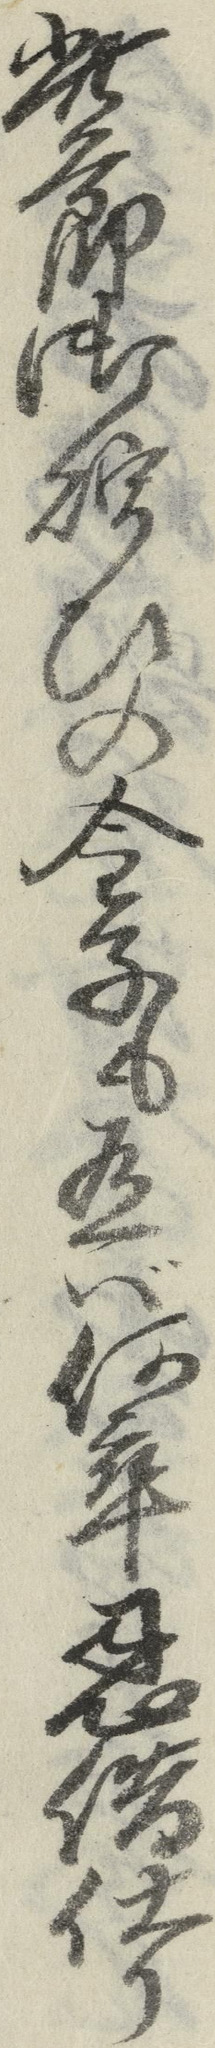此節御貯ひの金子も有は何卒忍借仕り
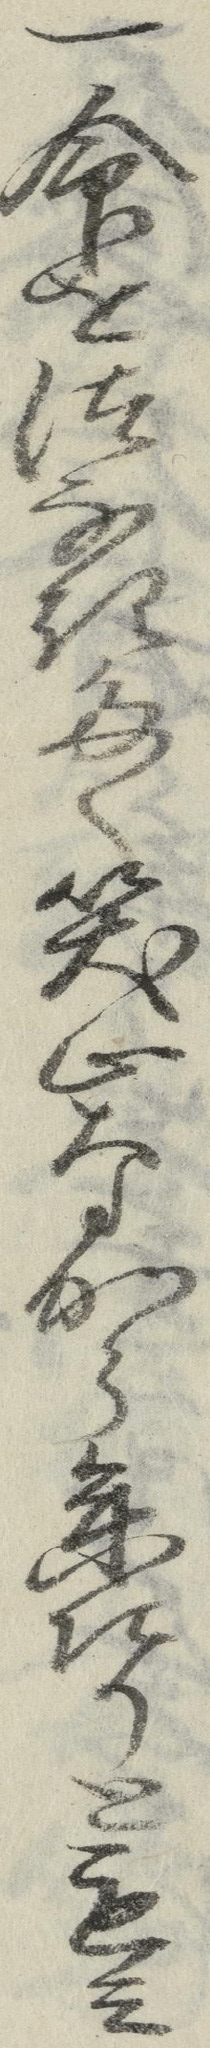一命をつなきたく笑止なから参たりともみ
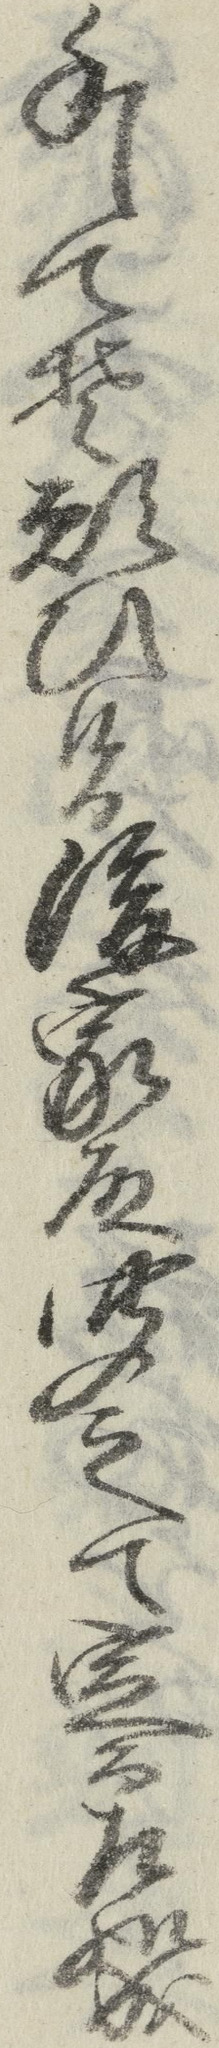手してそ願ける後家殿聞之て定而左様成
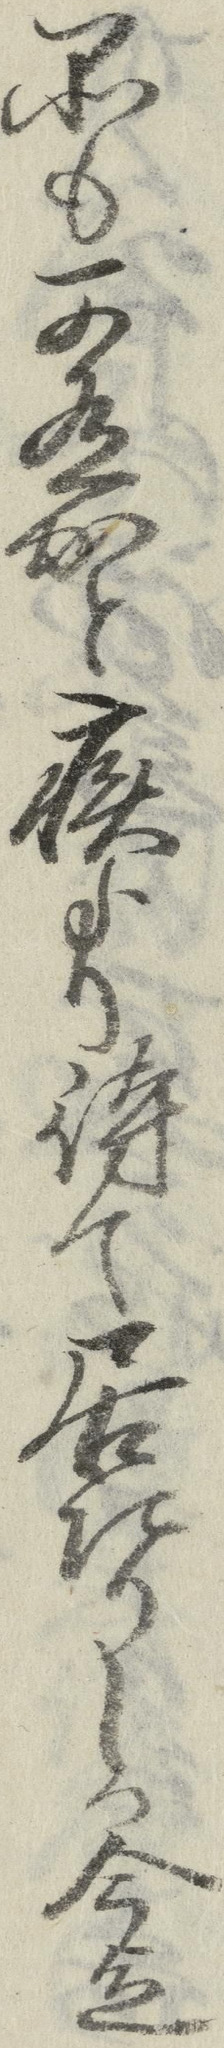品も可有かと疾より待て居たりしか今迄
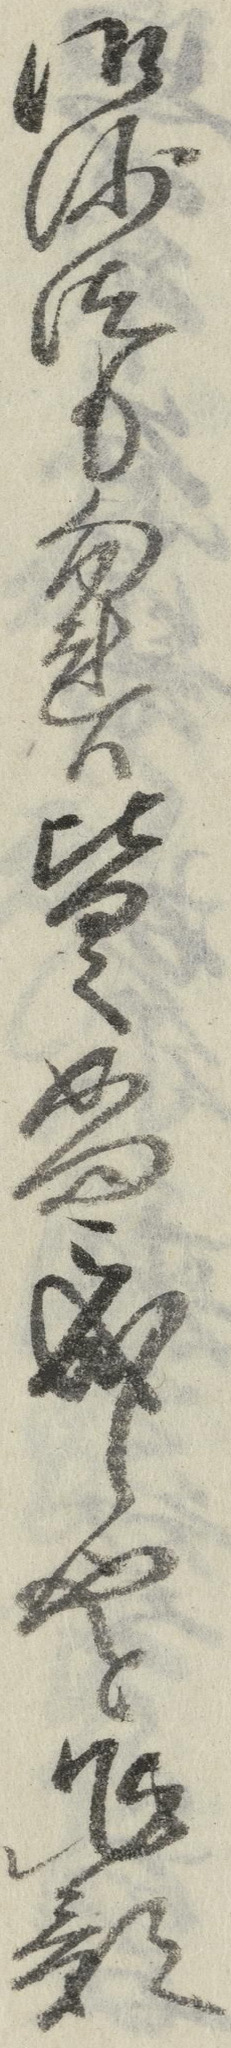御沙汰も勿れは皆々如何被成候やと乍願
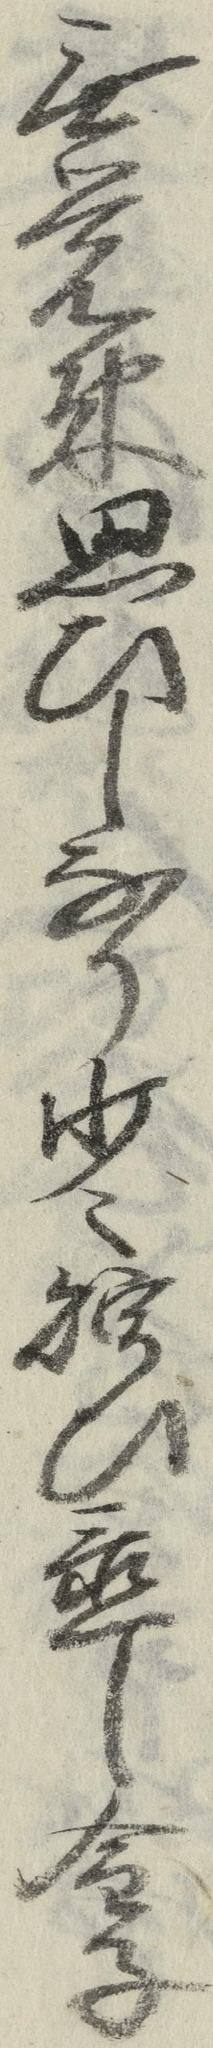無覚束思ひしなり少々貯ひ置し金子
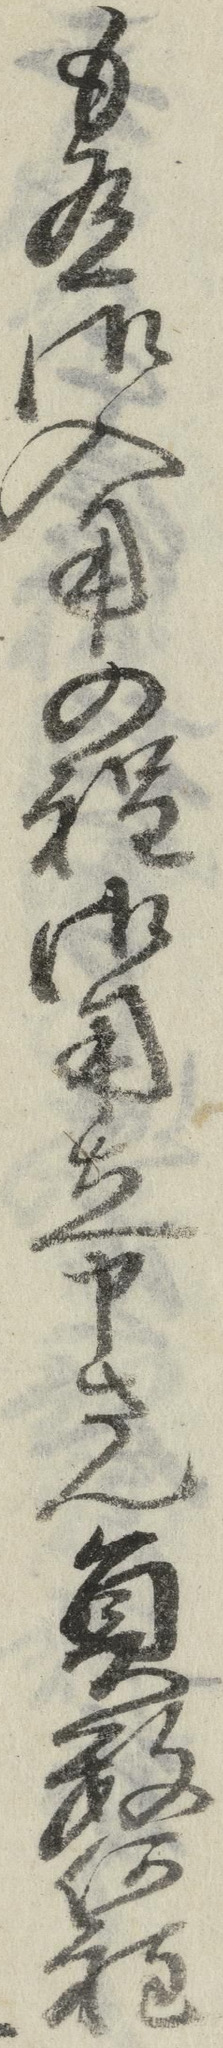も有御入用の程御用立申さん員数何程
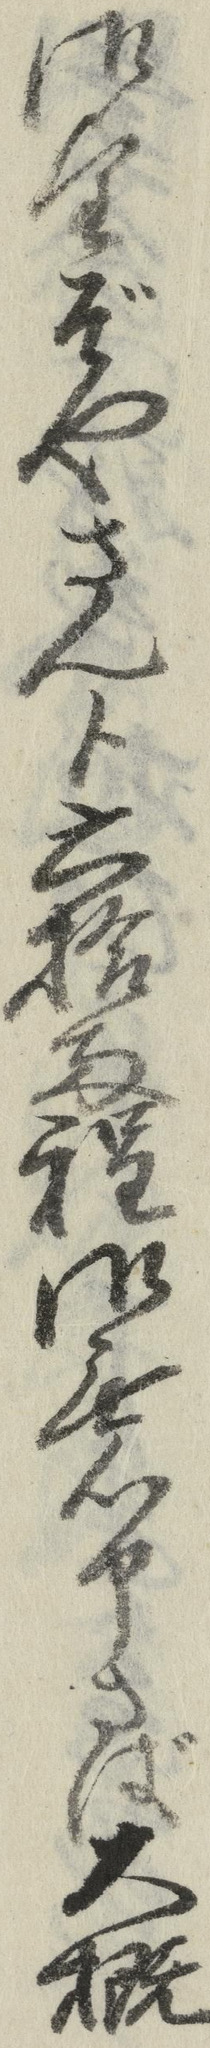御望ぞやさん候六拾両程御無心申さば大概

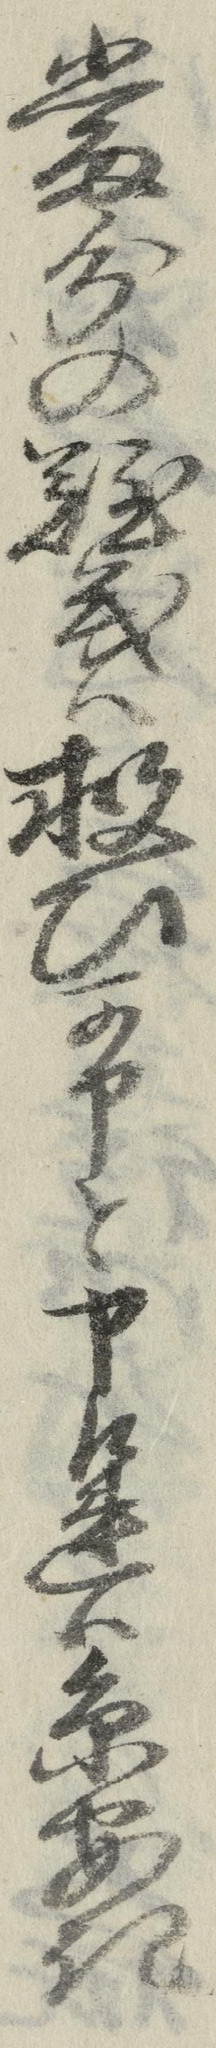当今の難義ハ救ひ可申と申けれは糸安き
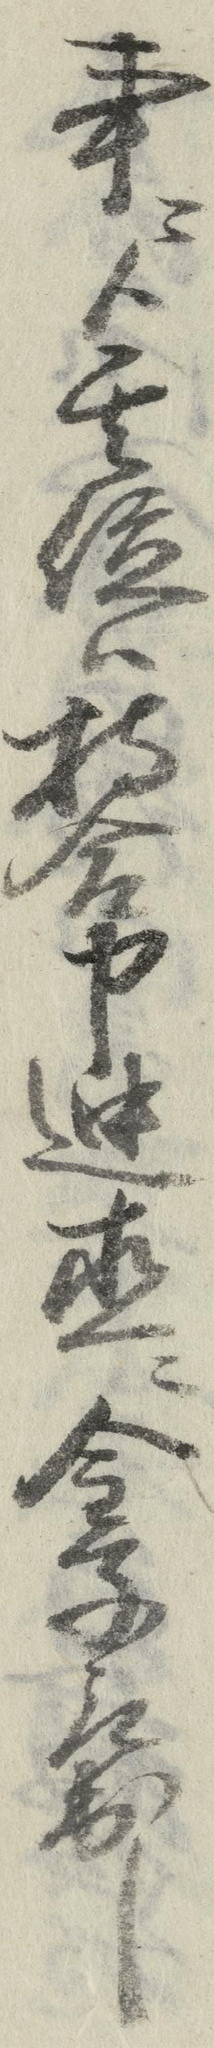事に候其位は持合申迚直に金子取出し
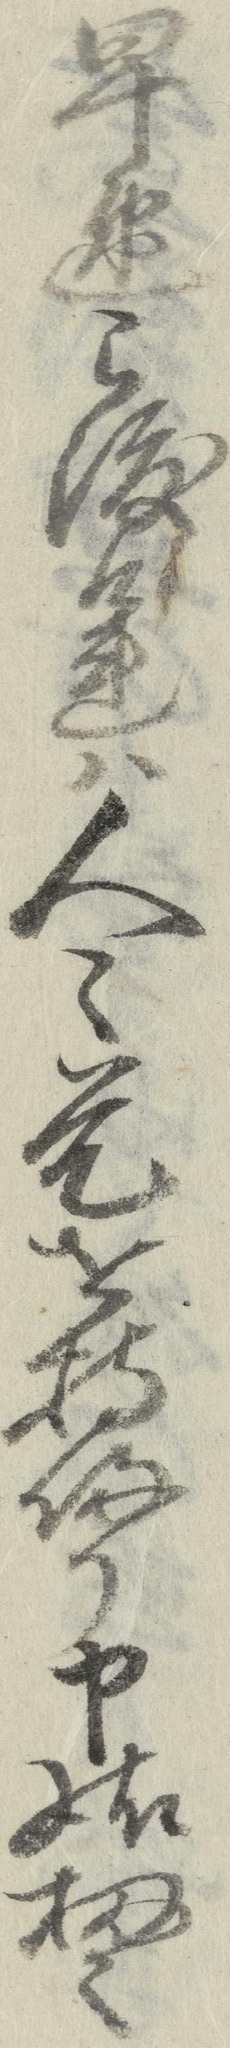早速被渡けれは人々是を持帰り申様扨々
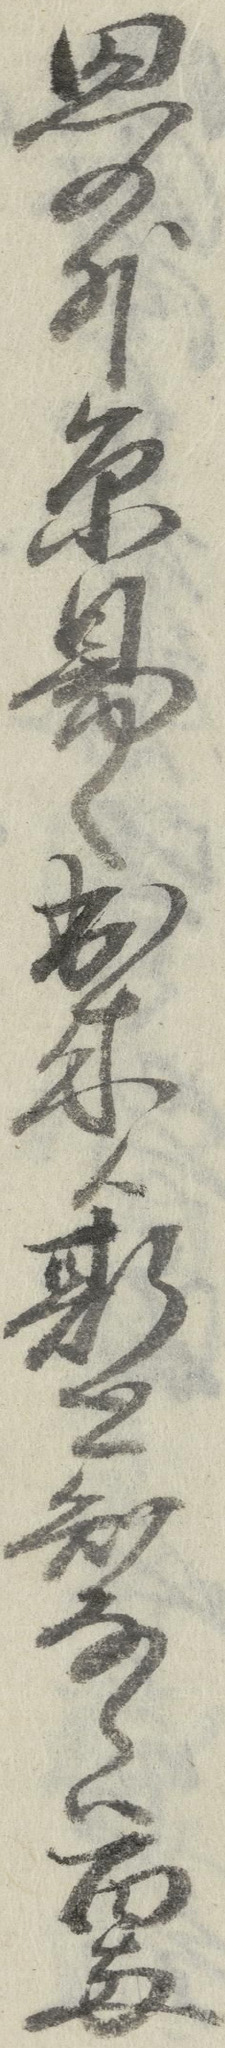思の外糸易く出来候斯と知ならハ百両
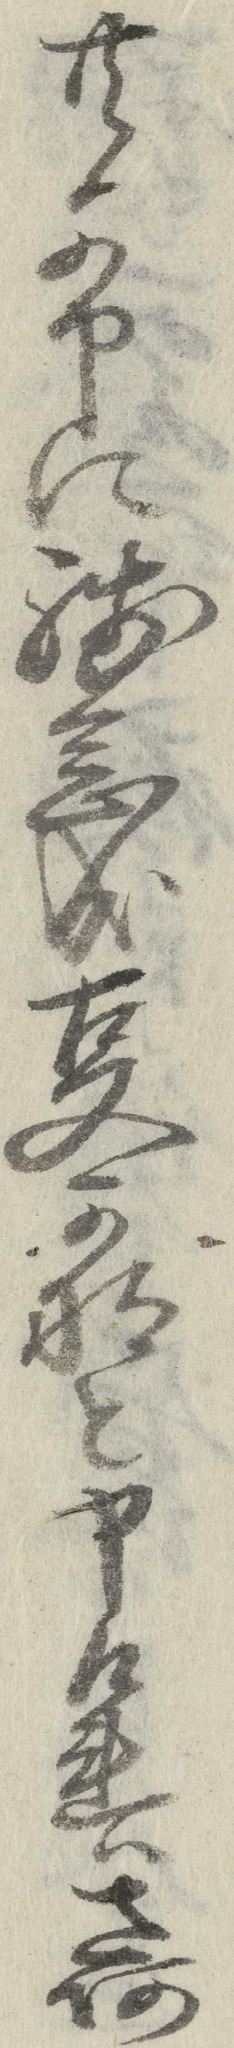共可申に残甚成事かなと申けれはさあ
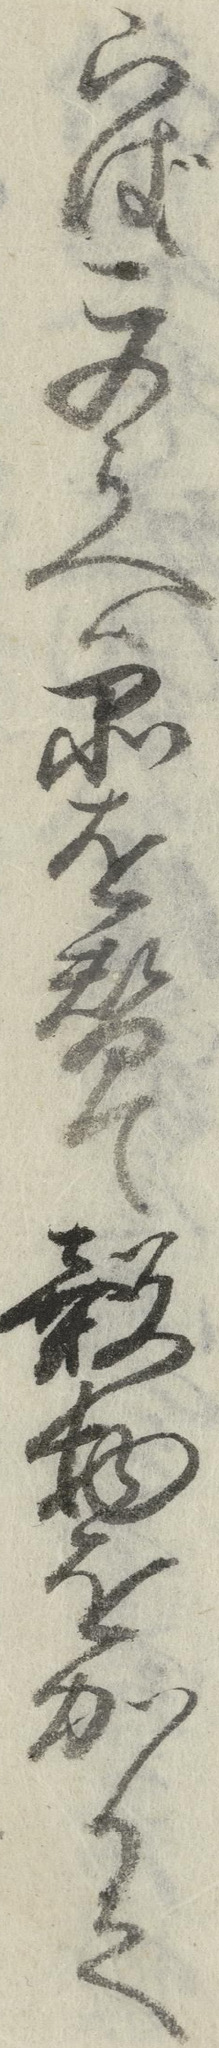らばこのうへは品を替て穀物をかりて
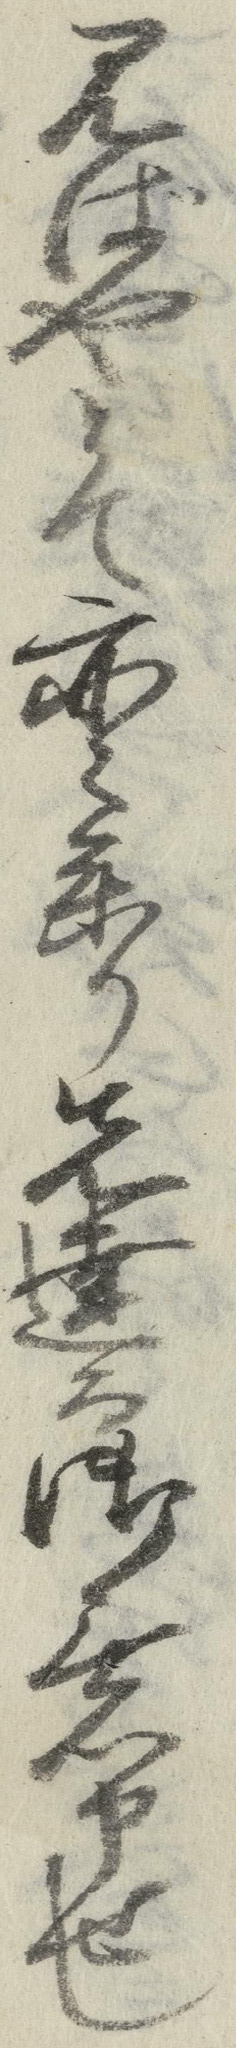見ばやとて亦々参り先達而御無心申せし
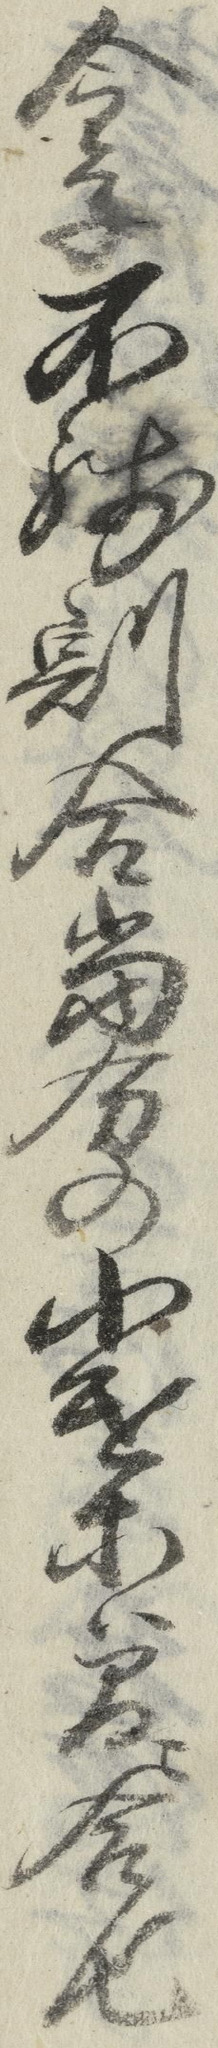金子不残割合当分の小遣等ハ間に合せ
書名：浅間大焼騒動記　中
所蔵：東京大学地震研究所図書室 Earthquake Research Institute Library, The University of Tokyo, JAPAN
